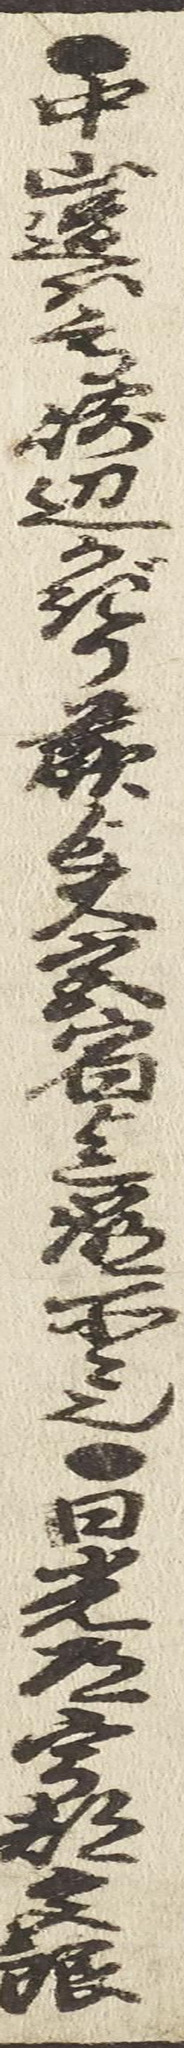●中山道は高崎辺かぎり蕨ゟ大宮宿迄崩所々也●日光道宇都宮限
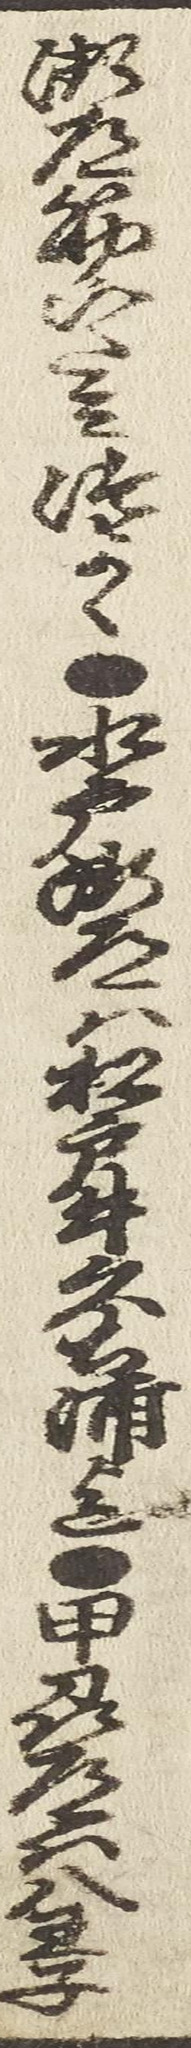街道筋いたみつよく●水戸街道は松戸牛久土浦迄●甲州道は八王子
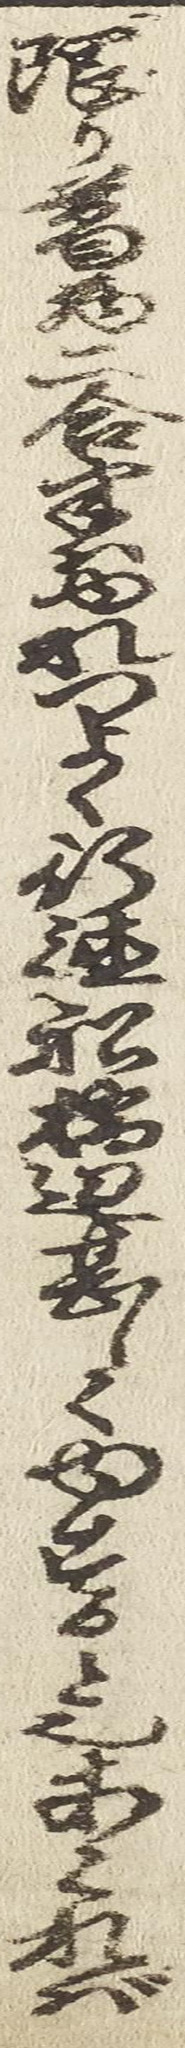限り葛西二合半はゆれつよく行徳船橋辺甚しくゆすると也あられば
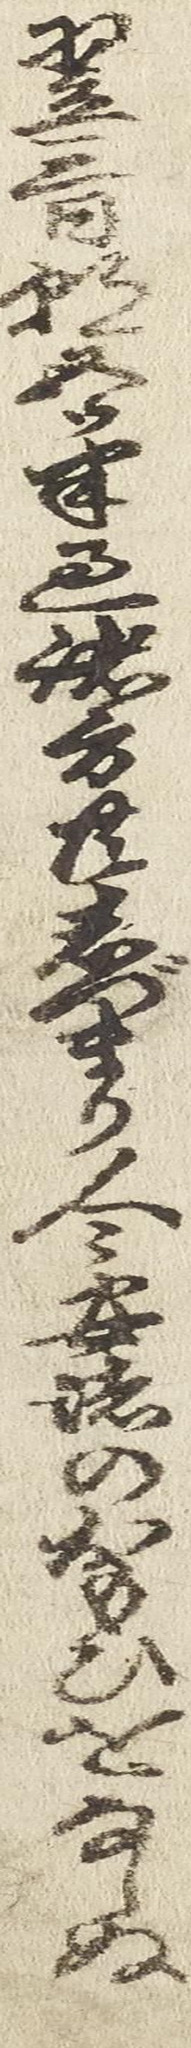翌三日朝五ツ半過諸方共すづまり人々安堵のおもひをなしぬ
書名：江戸みやげ
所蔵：東京大学地震研究所図書室 Earthquake Research Institute Library, The University of Tokyo, JAPAN
